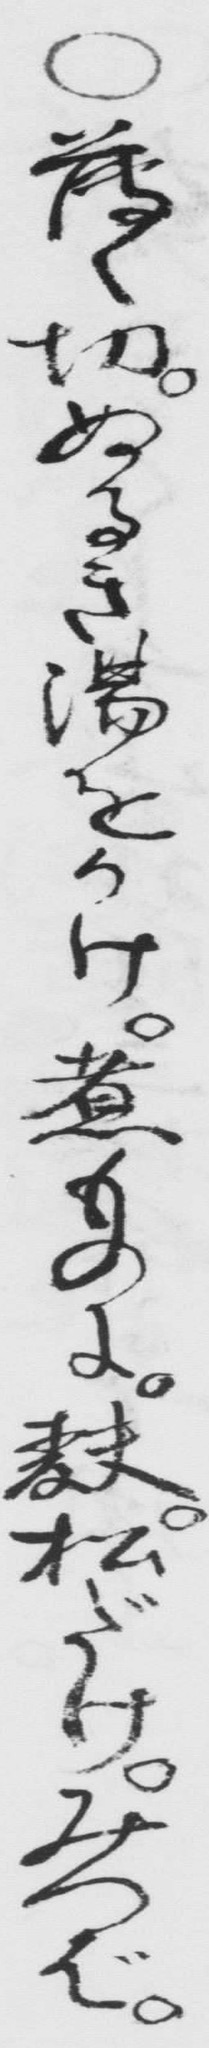○薄く切。ぬるき湯をかけ。煮ものに。麩。松だけ。みつば。
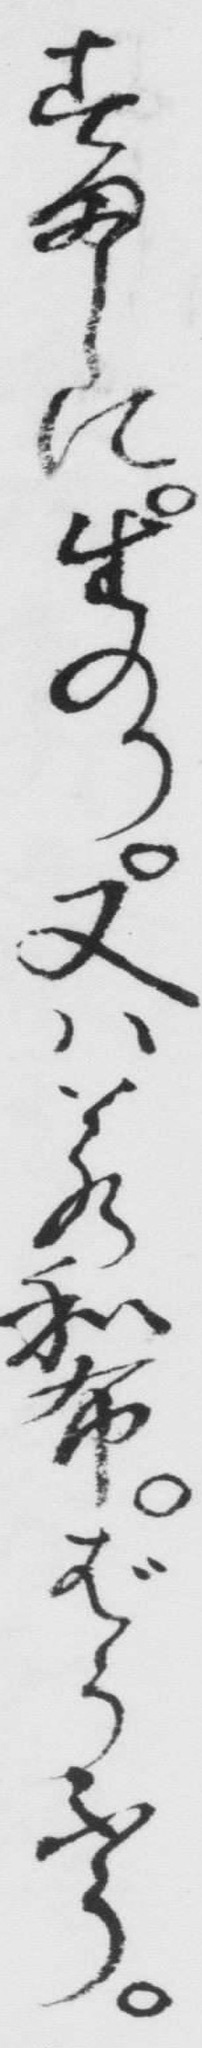すましに。生のり、又は若和布。ばうふう。
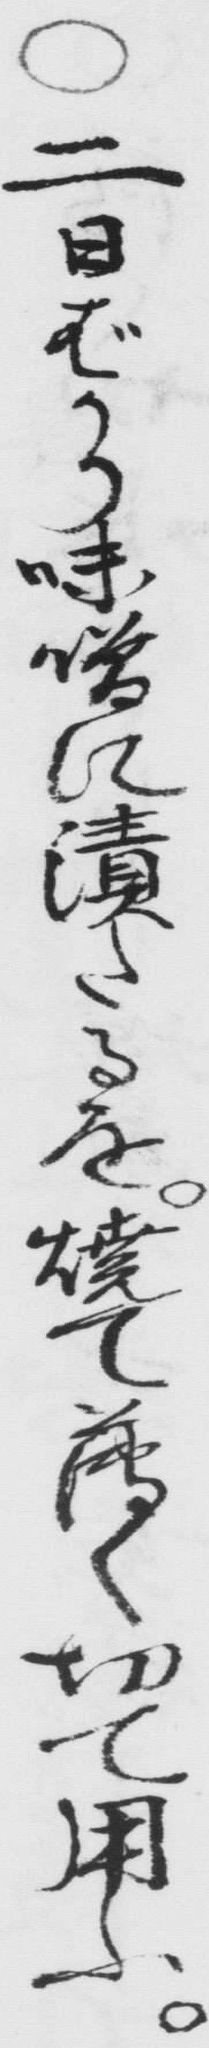○二日ばかり味噌に漬たるを。焼て薄く切て用ふ。
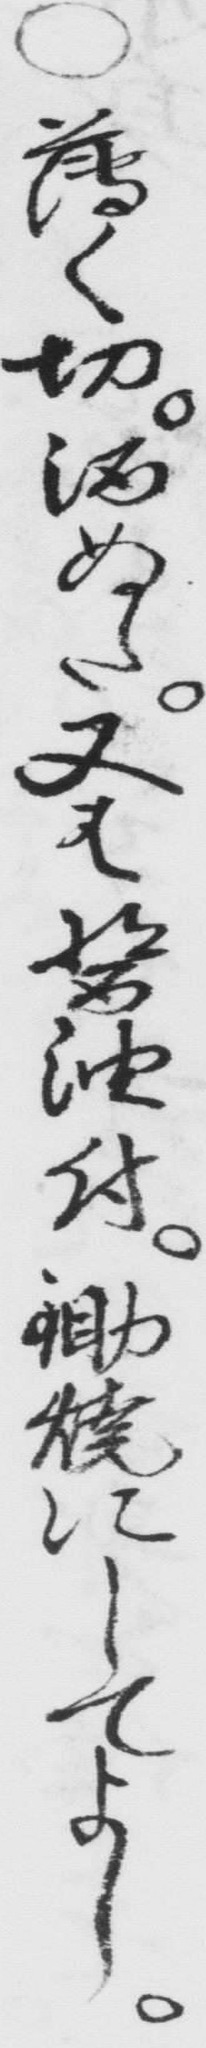○薄く切。酒ぬた。又は醤油付。鋤焼にしてよし。
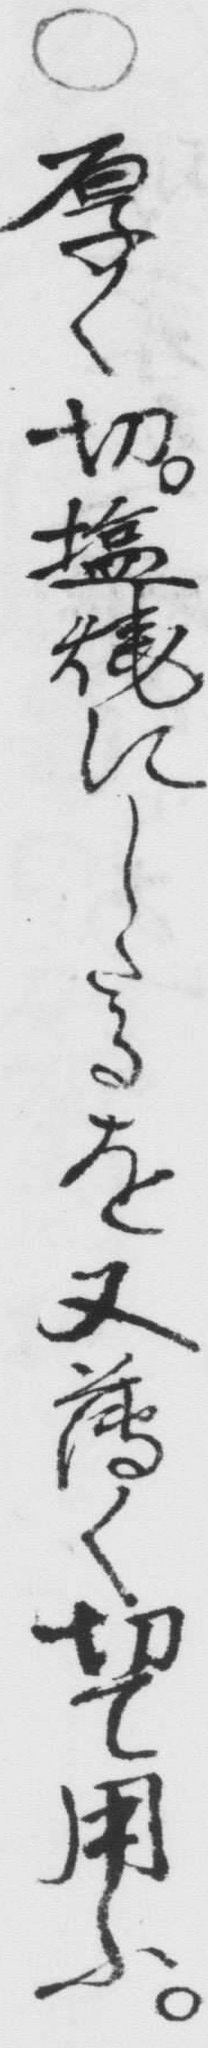○厚く切。塩焼にしたるを又薄く切て用ふ。
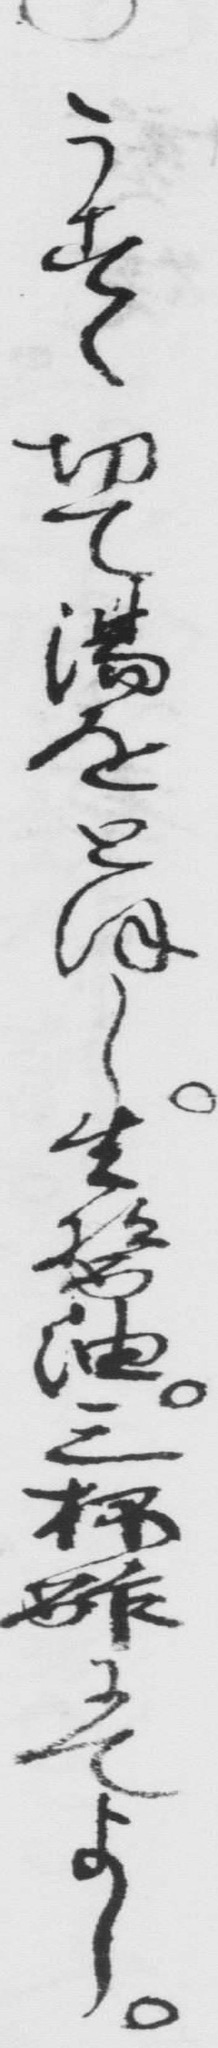○うすく切て湯をとほし。生醤油。三杯酢にてよし。

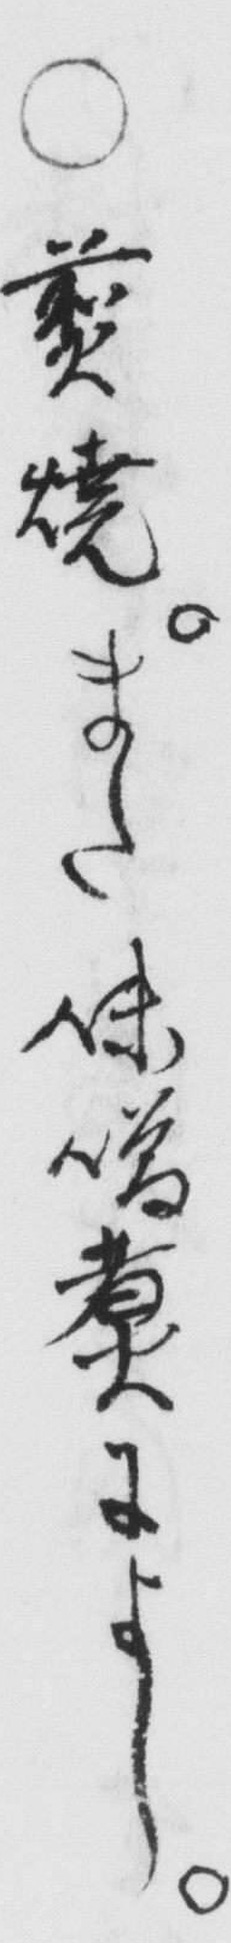○煎焼。また味噌煮によし。
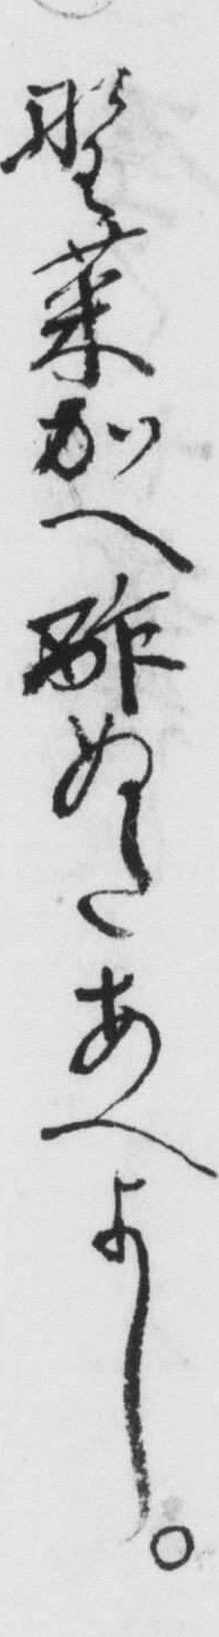○野菜加へ酢ぬたあへよし。
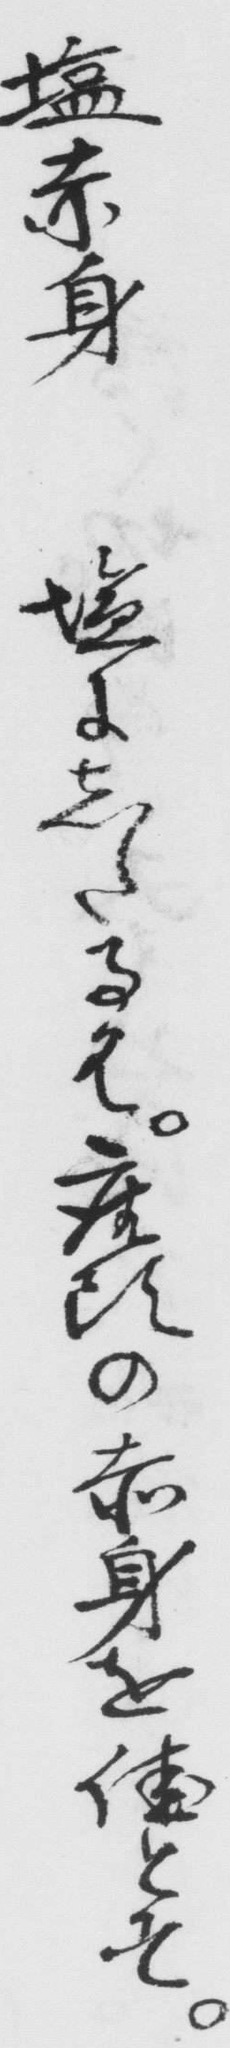塩赤身塩にしたるは。座頭の赤身を佳とす。
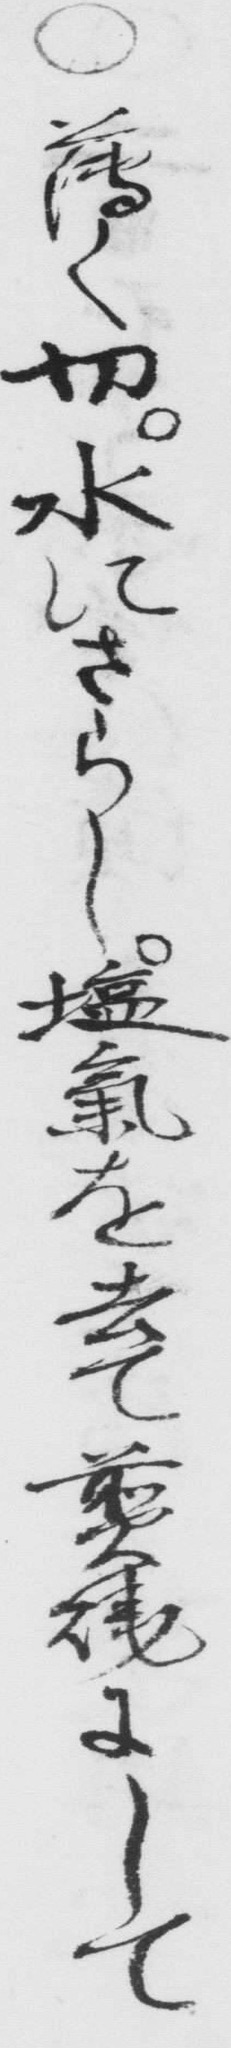○薄く切。水にさらし。塩気を去て煎焼にして
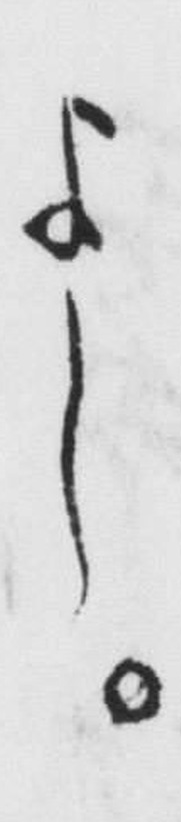よし。
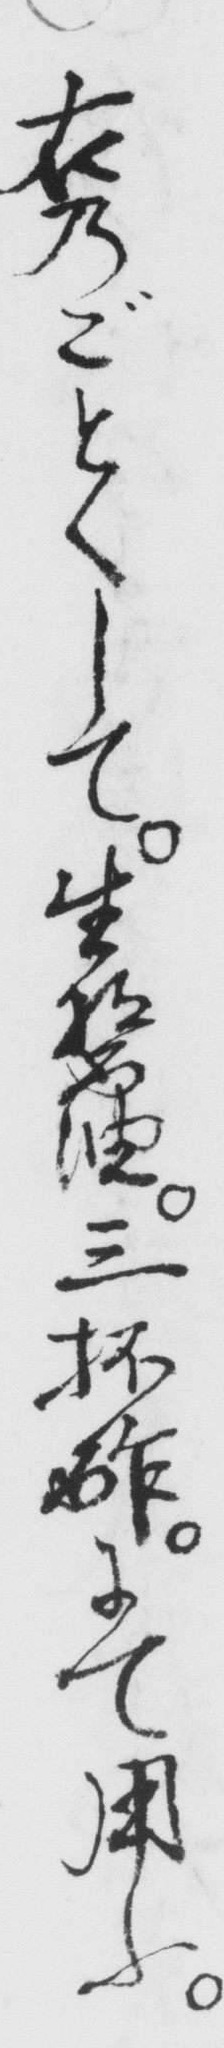○右のごとくして。生醤油。三杯酢。にて用ふ。
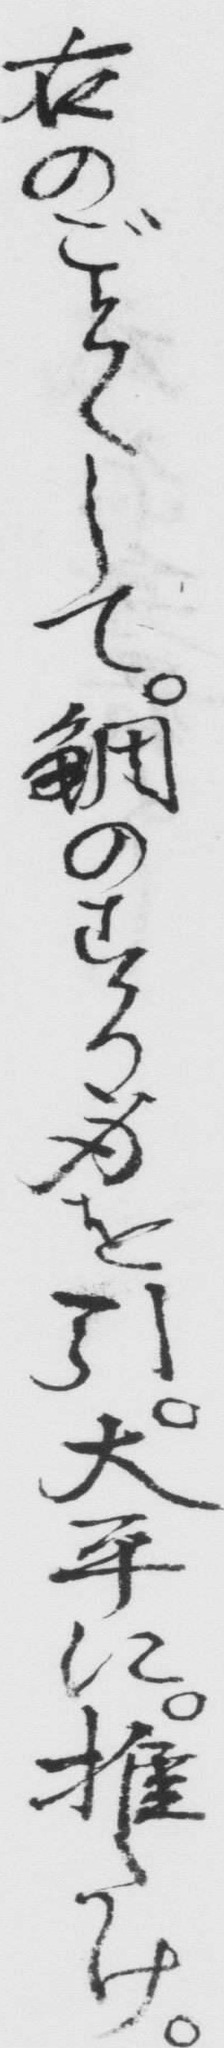○右のごとくして。鯛のすり身を引。大平に。椎たけ。
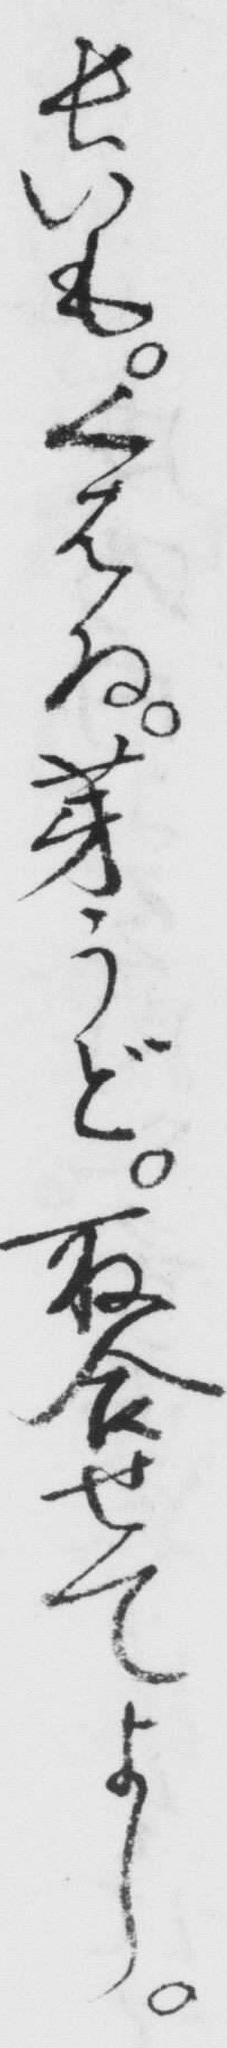長いも。くはゐ。芽うど。取合せてよし。
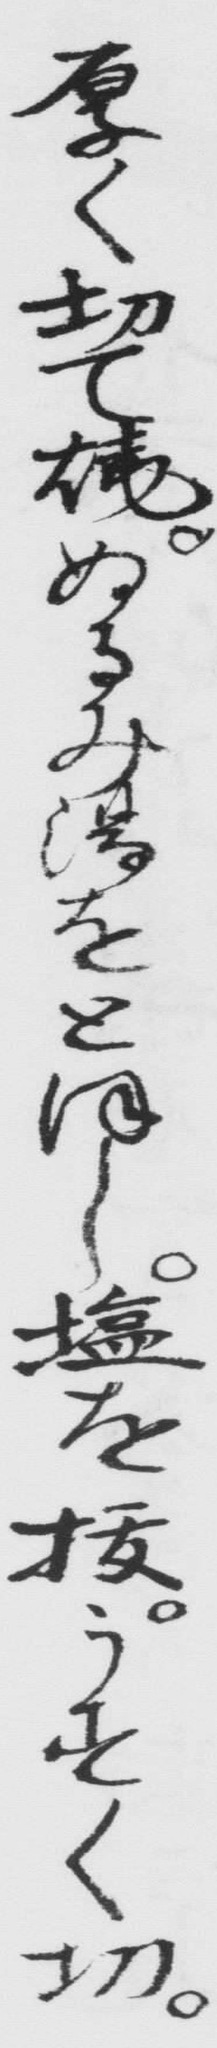○厚く切て焼。ぬるみ湯をとほし。塩を抜。うすく切。
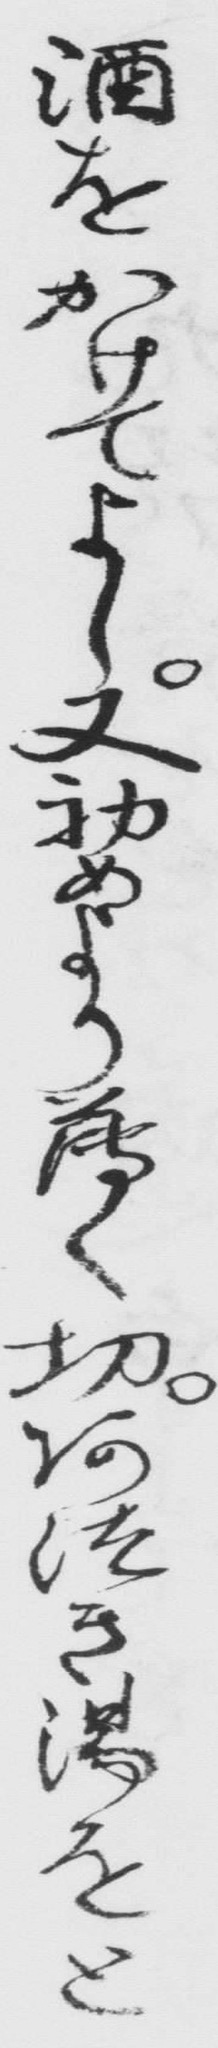酒をかけてよし。又初めより薄く切。あつき湯をと
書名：鯨肉調味方
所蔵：大阪府立大学学術情報センター 国文学研究資料館
